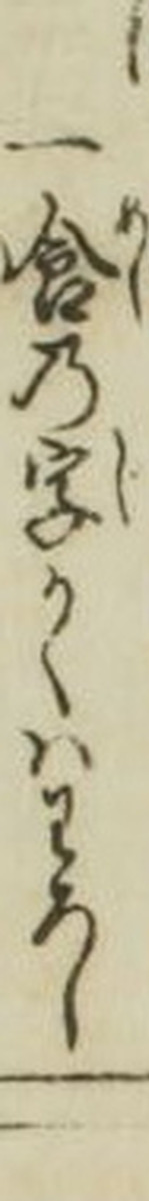一食の字かくはわろし
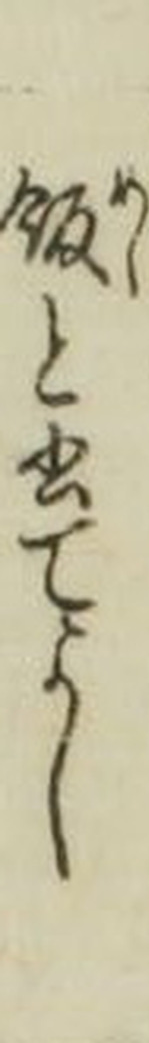飯と書てよし
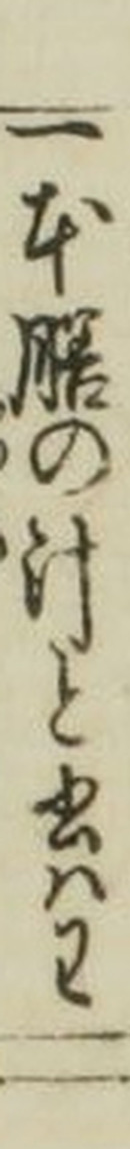一本膳の汁と書はわ
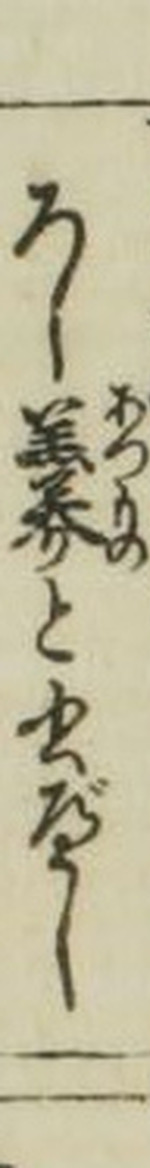ろし羹と書べし
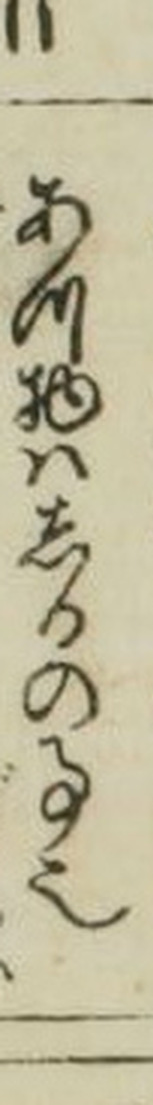あつ物はしるの事也
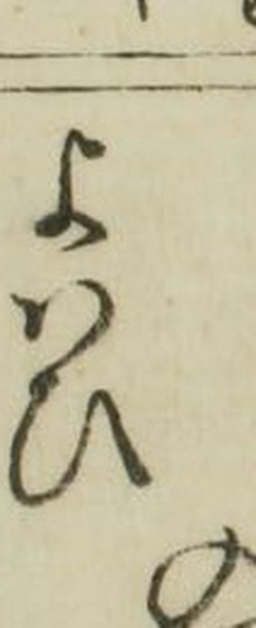よはひ
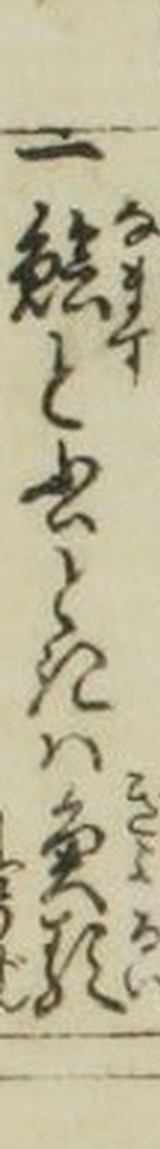一鱠と書ときは魚類
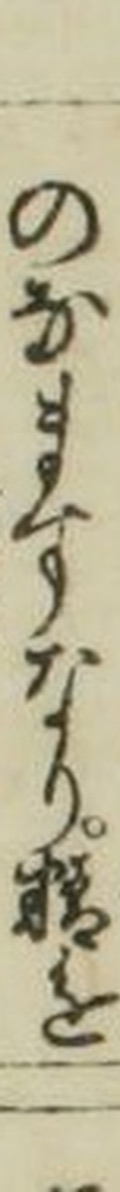のなますなり。精進
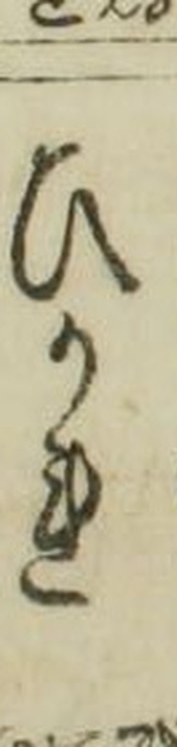ひかれ
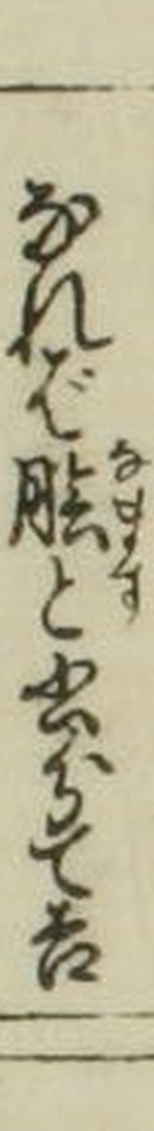なれば膾と書分て吉
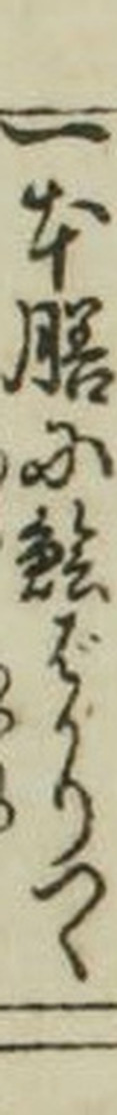一本膳に鱠ばかりつく
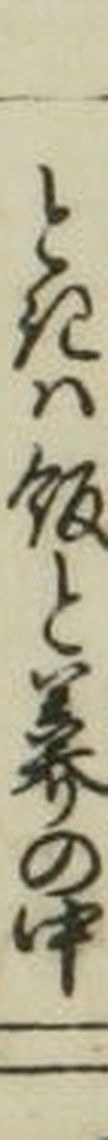ときは飯と羹の中
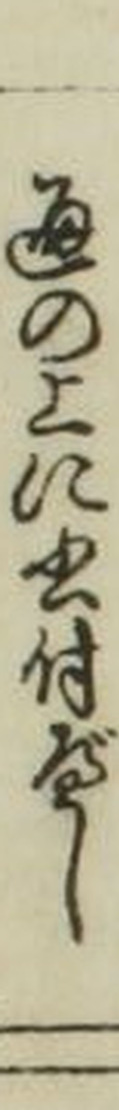通の上に書付べし
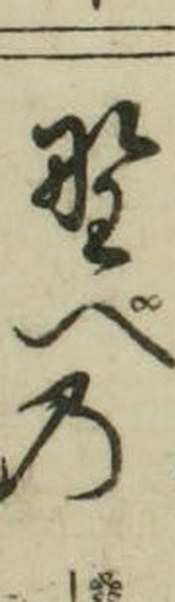野べの
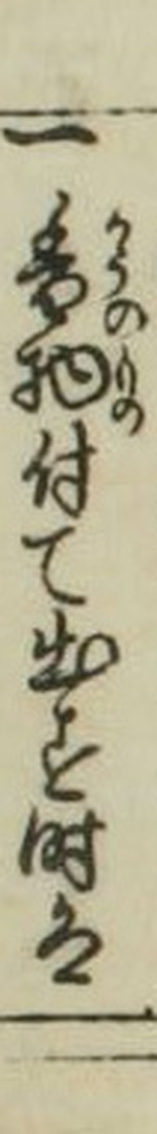一香物付て出す時は
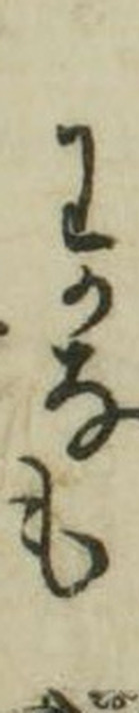わかなも
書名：女源氏教訓鑑
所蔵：東京学芸大学附属図書館
